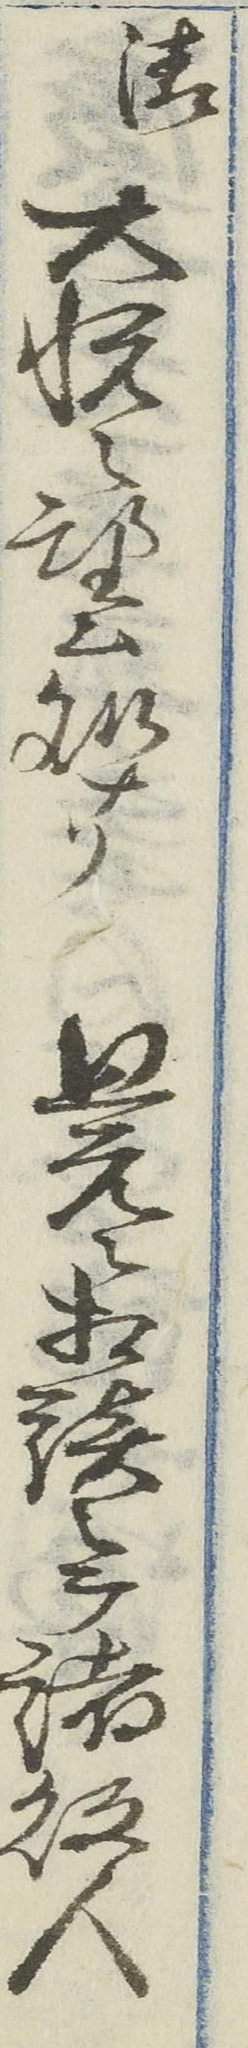清大悦之望ム処ナリ且元ニ相談シテ諸役人
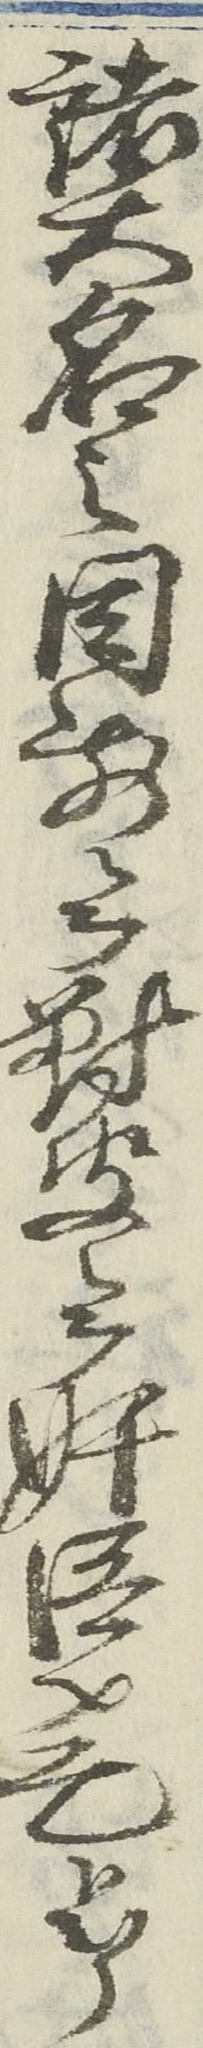諸大名之目前ニテ対決シテ奸臣ヲ亡ト云う
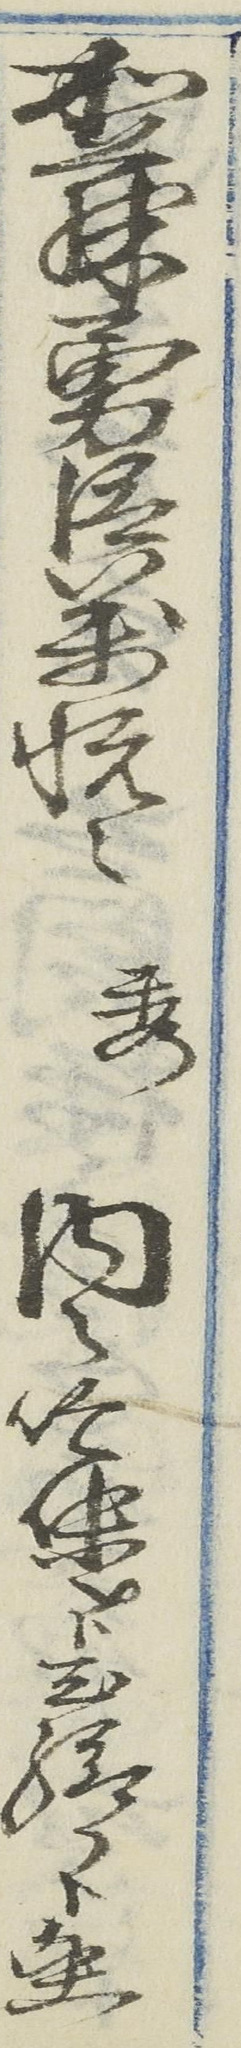加藤勇臣万悦ニ秀内々吟味ヲト云給フト雖
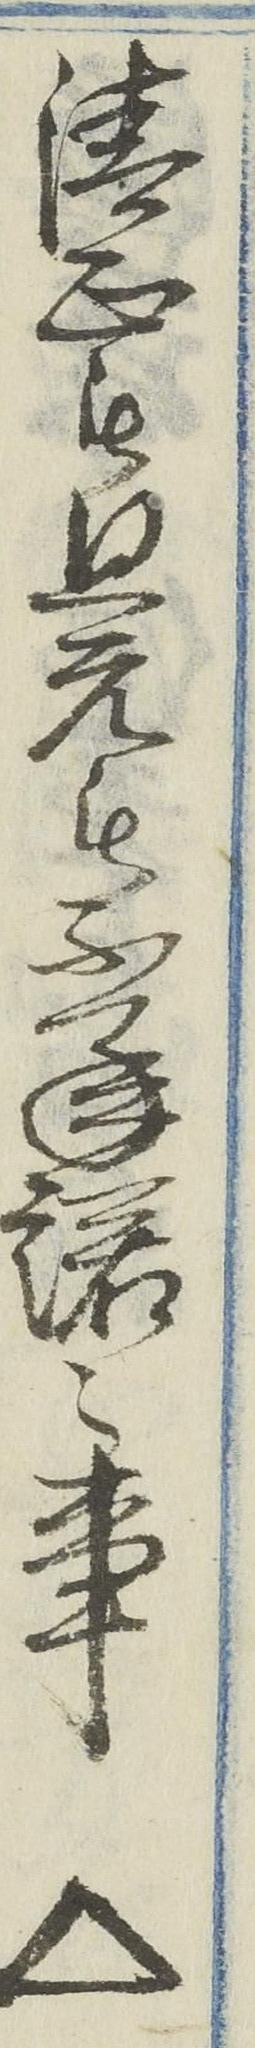清正も且元も不承諾之事△
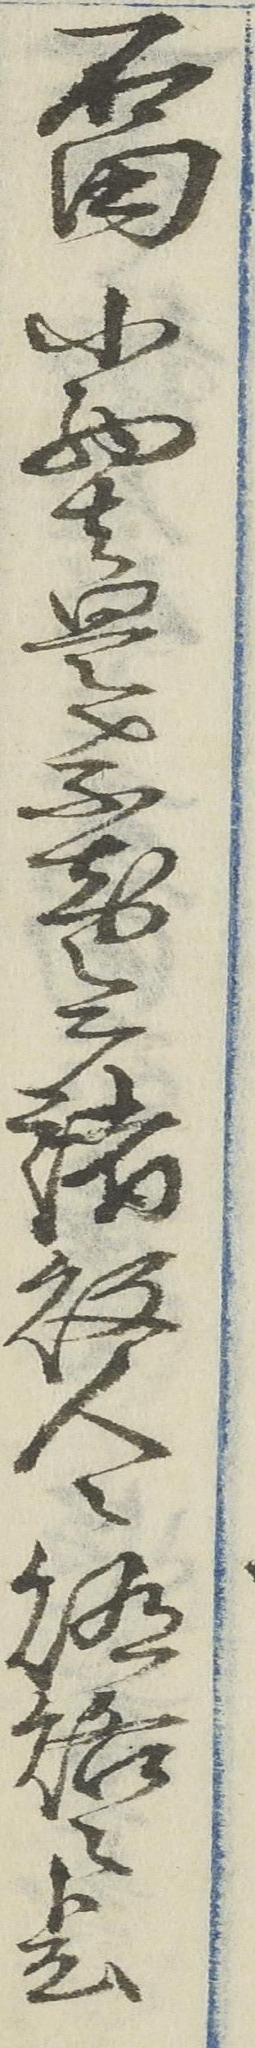石田小西は是ヲ不知ニテ諸役人ニ賄賂ニト云

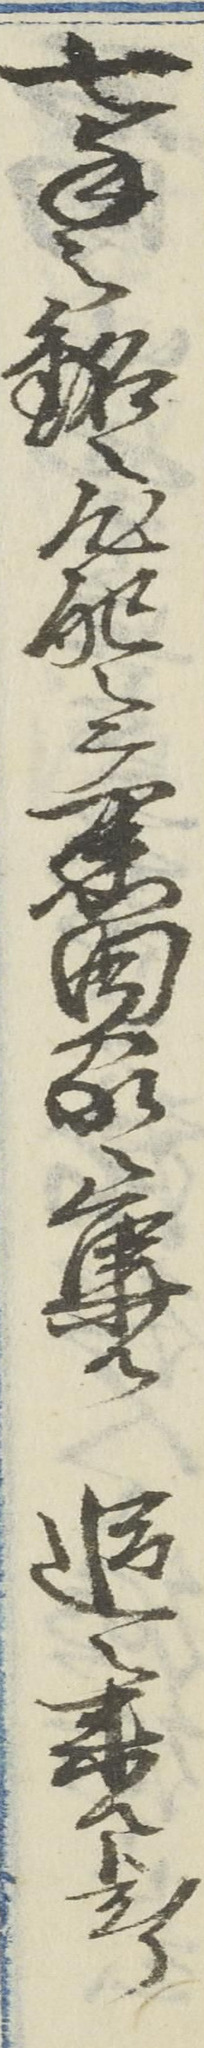七手之銘々心配ニテ黒田家に集ル追々来ルト云リ
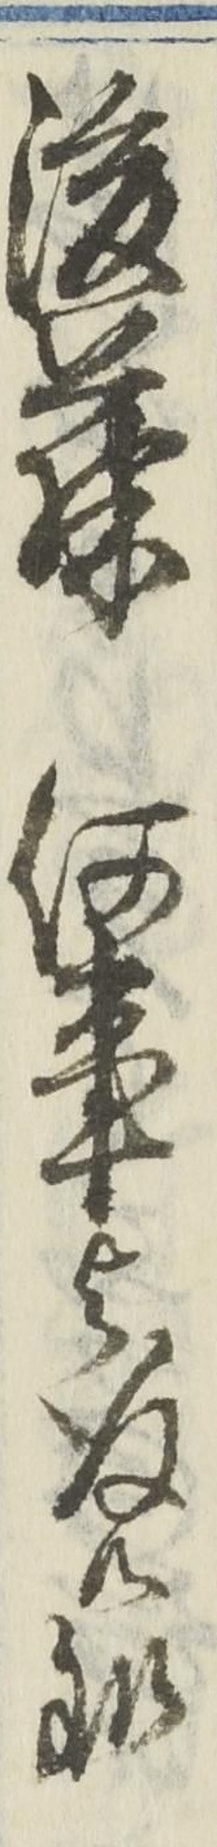後藤何事と存ル処
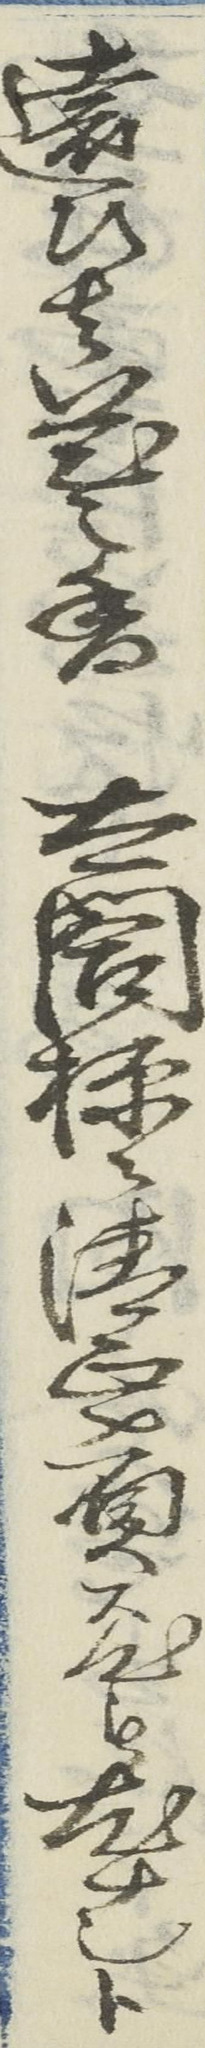遠ひは花之香太閤様ニ清正負ス心も尤ナレト
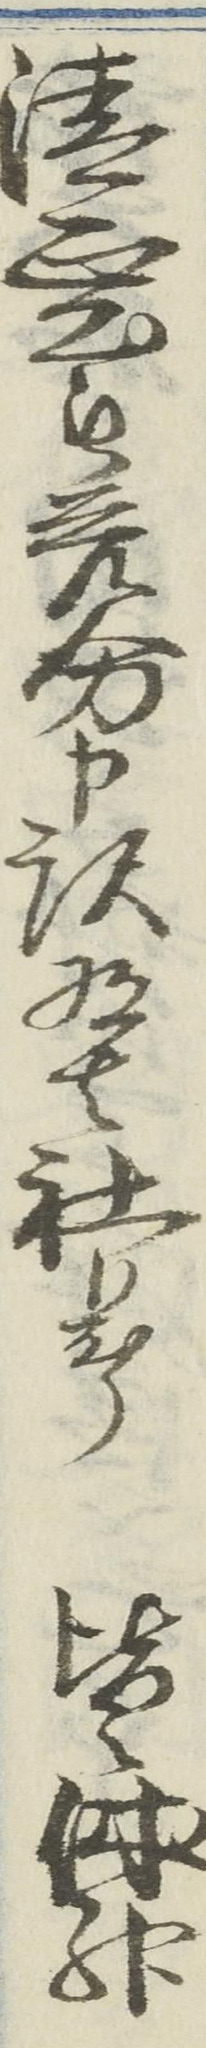清正公も充分申訳有は社ト云う皆々休服
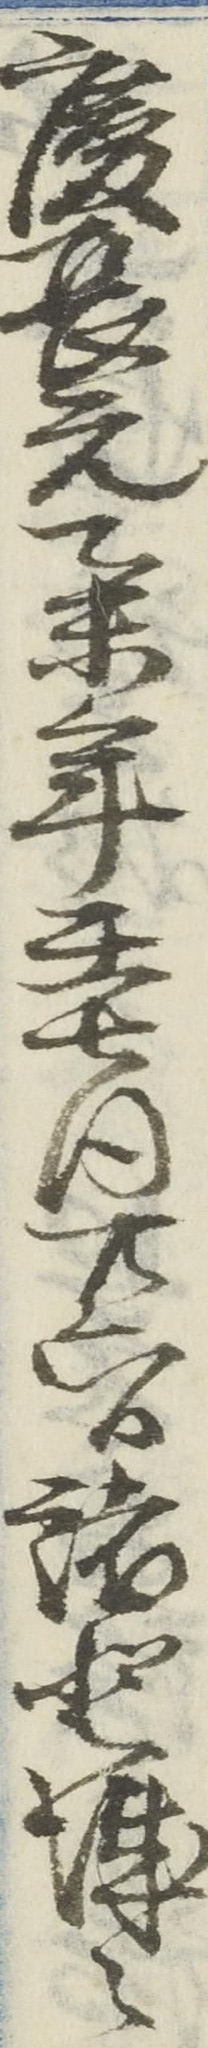慶長元乙未年壬七月廿六日諸登城之
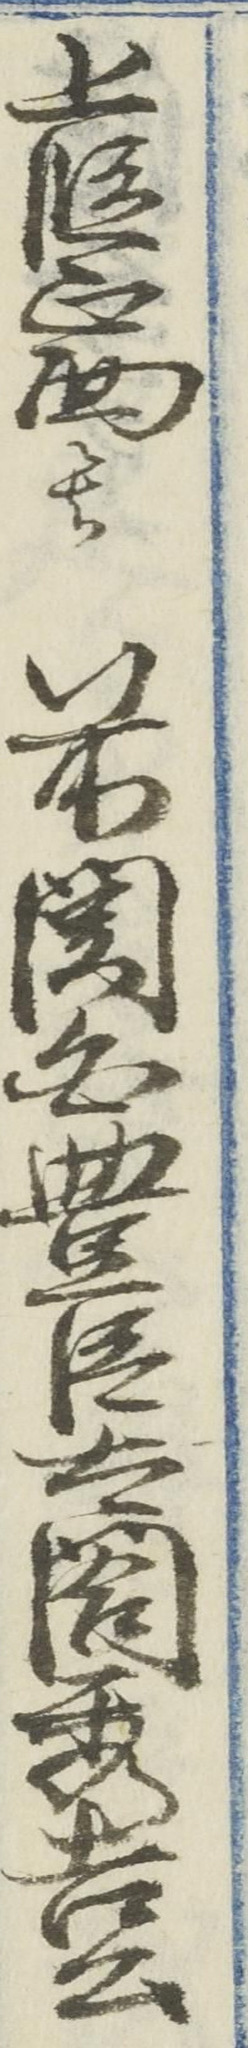上段正面ニは前関白豊臣太閤秀吉公
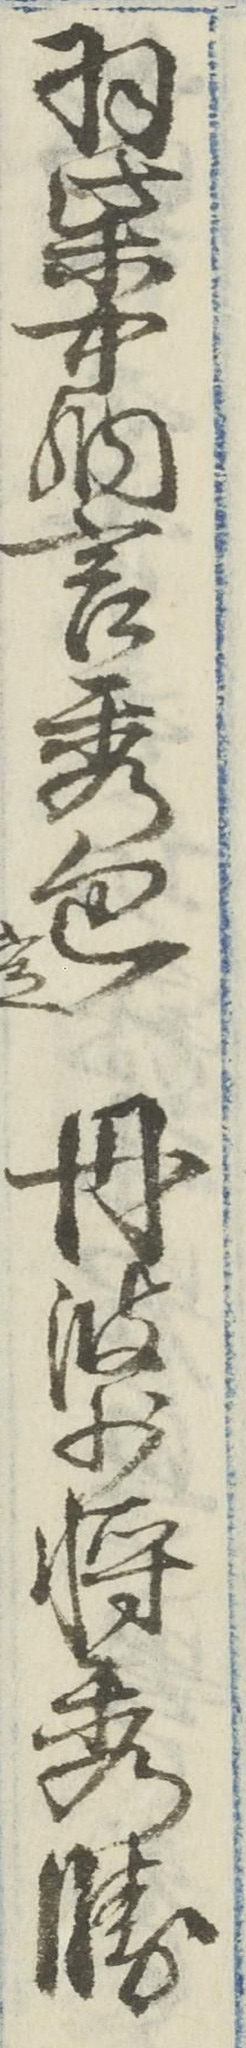羽柴中納言秀包丹波少将秀勝
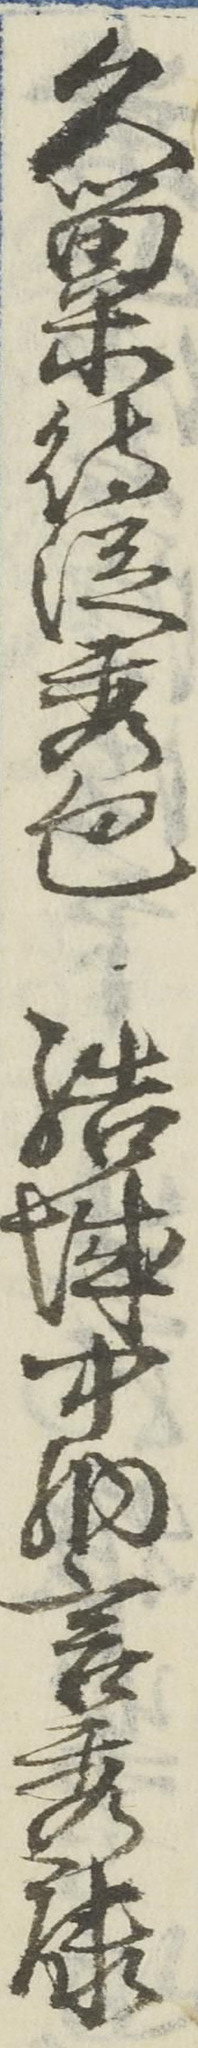久留米侍従秀包結城中納言秀康
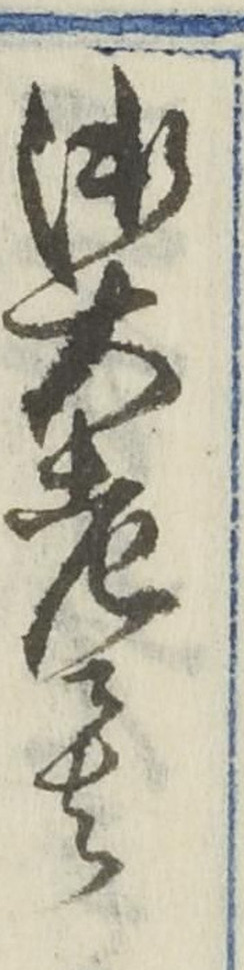御大老ニは
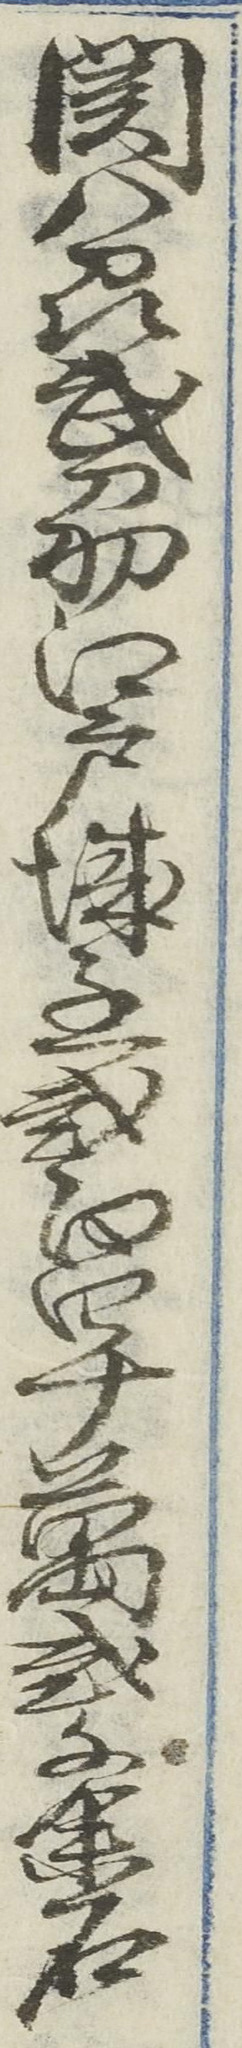関八州武州江戸城主弐百四十万弐千余石
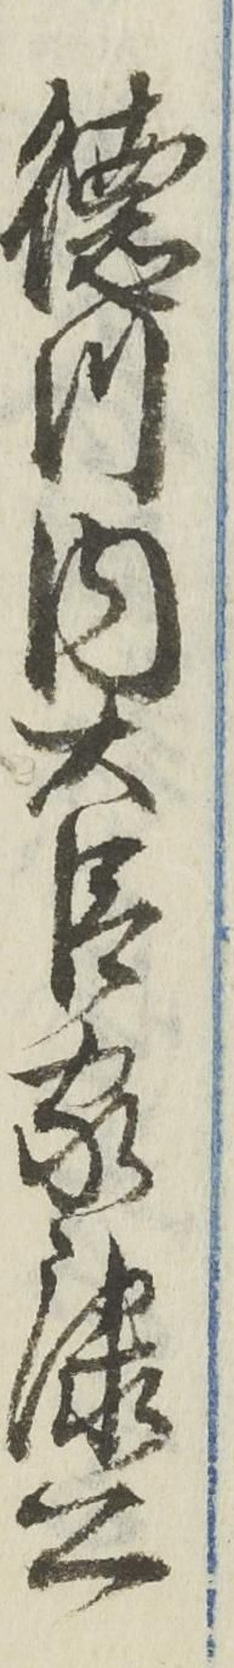徳川内大臣家康公
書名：伏水大地震
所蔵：東京大学地震研究所図書室 Earthquake Research Institute Library, The University of Tokyo, JAPAN
